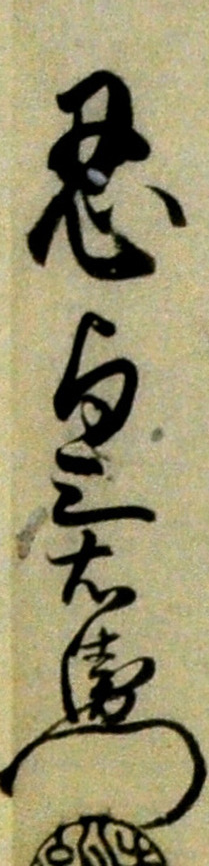忍与三右衛門㊞
